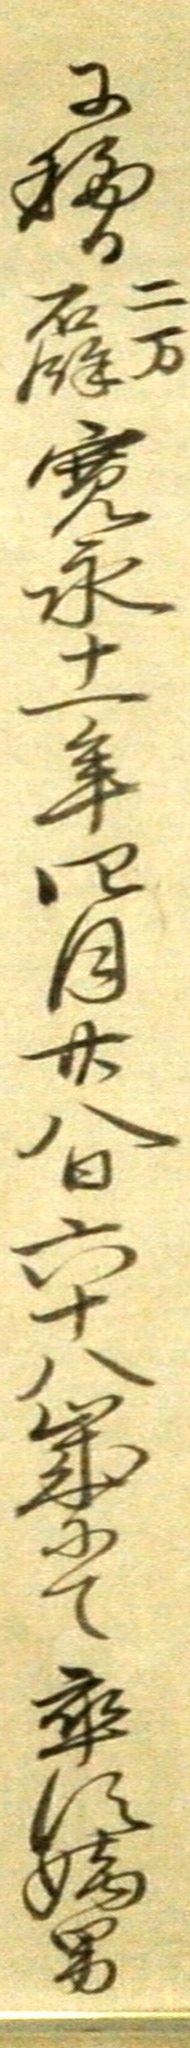に移る二万石余寛永十一年四月廿八日六十八歳にて卒す嫡男
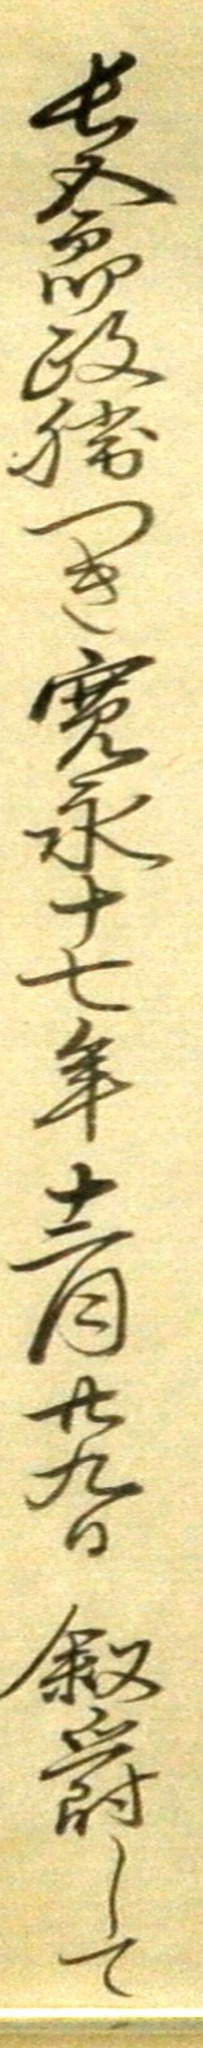長五郎政勝つき寛永十七年十二月廿九日叙爵して
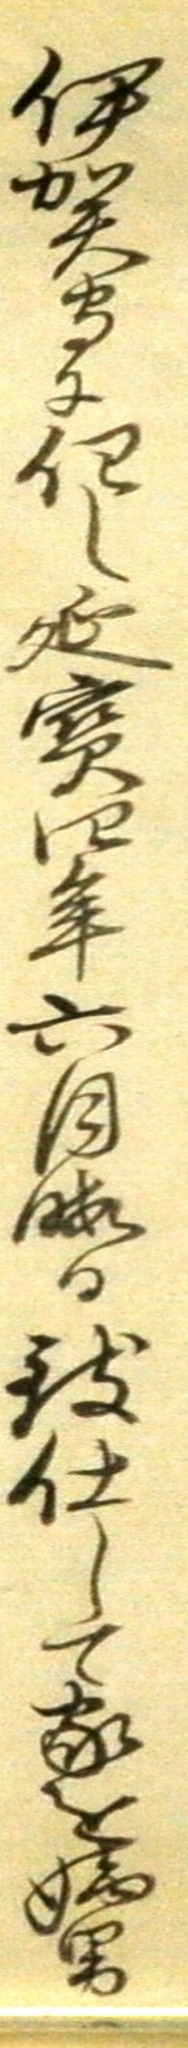伊賀守に任し延宝四年六月晦日致仕して家を嫡男
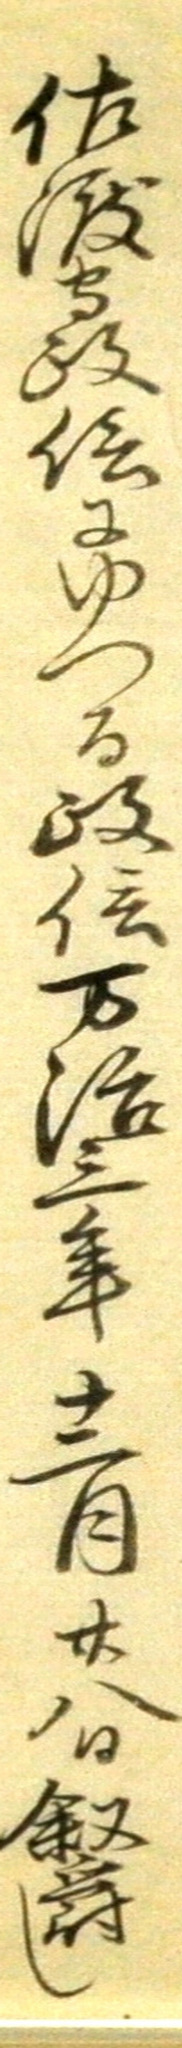佐渡守政信にゆつる政信万治三年十二月廿八日叙爵し
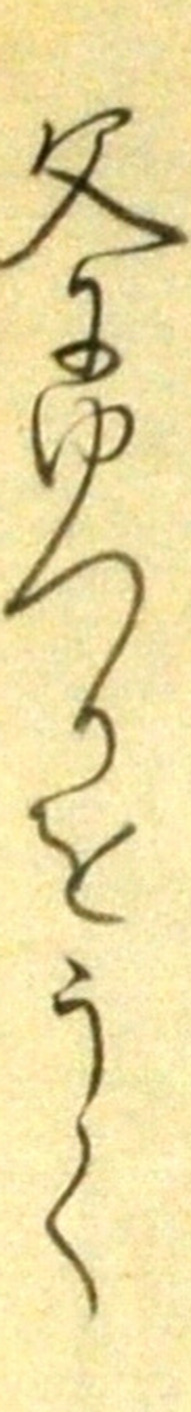父にゆつりをうく
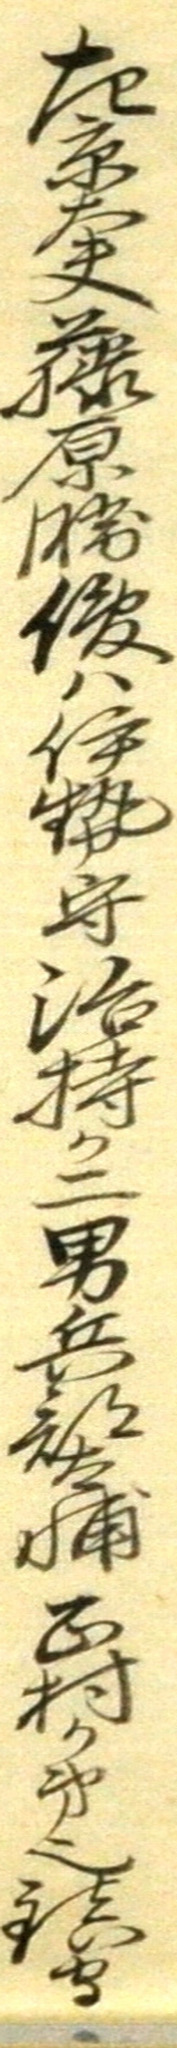左京大夫藤原勝俊は伊勢守治持か二男兵部大輔正村か弟也鎮守
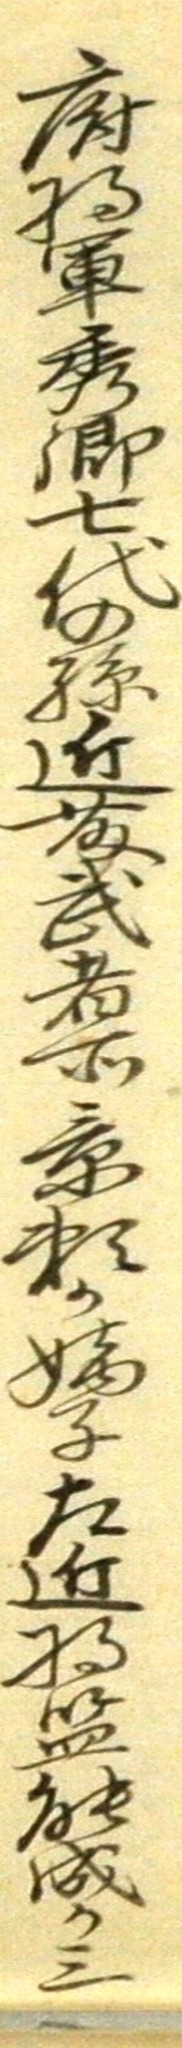府将軍秀郷七代の孫近藤武者所景頼か嫡子左近将監能成か三
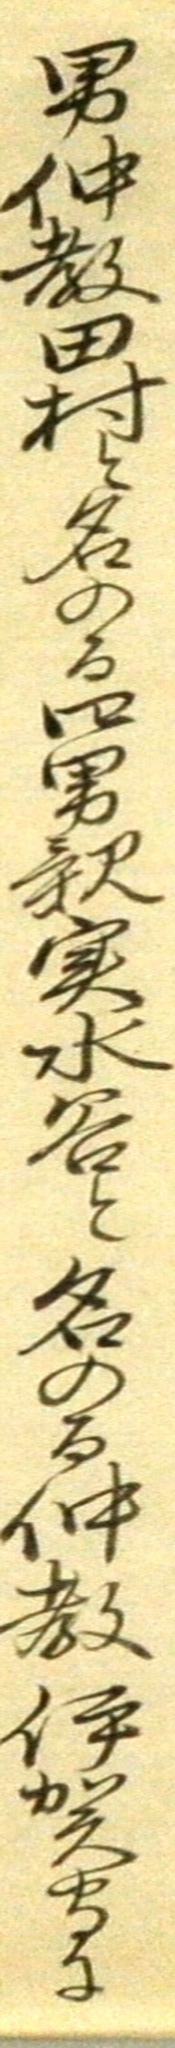男仲教田村と名のる四男親実水谷と名のる仲教伊賀守に
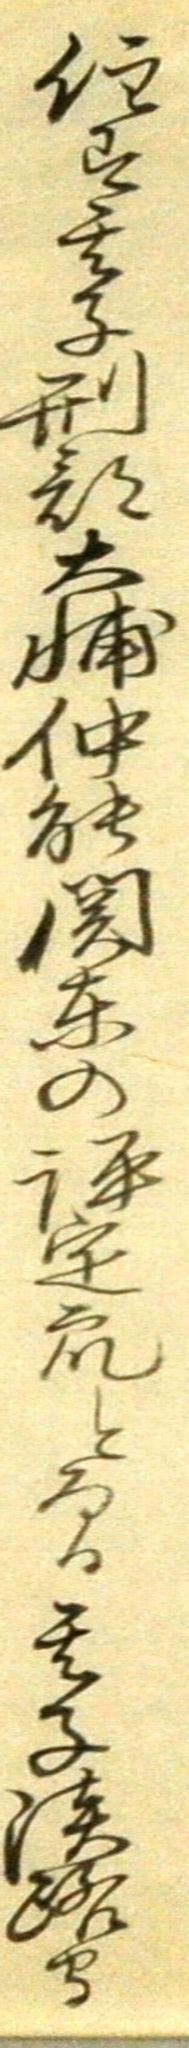任す其子刑部大輔仲能関東の評定衆となる其子淡路守
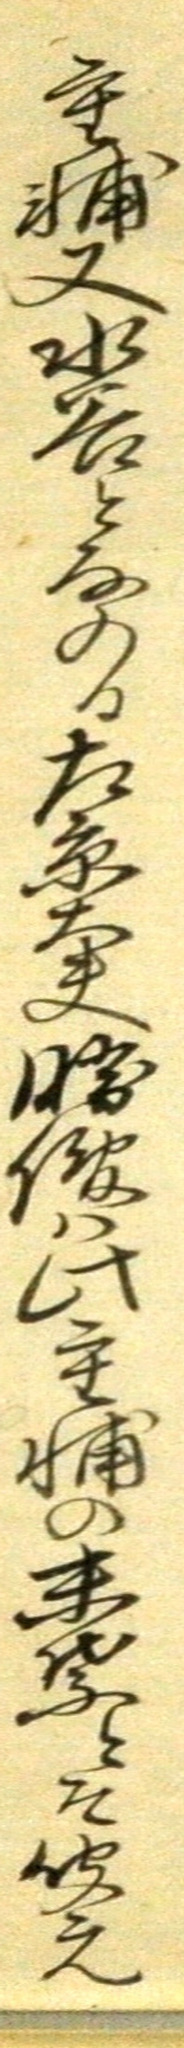重輔又水谷となのる左京大夫勝俊は此重輔の末葉とそ聞え
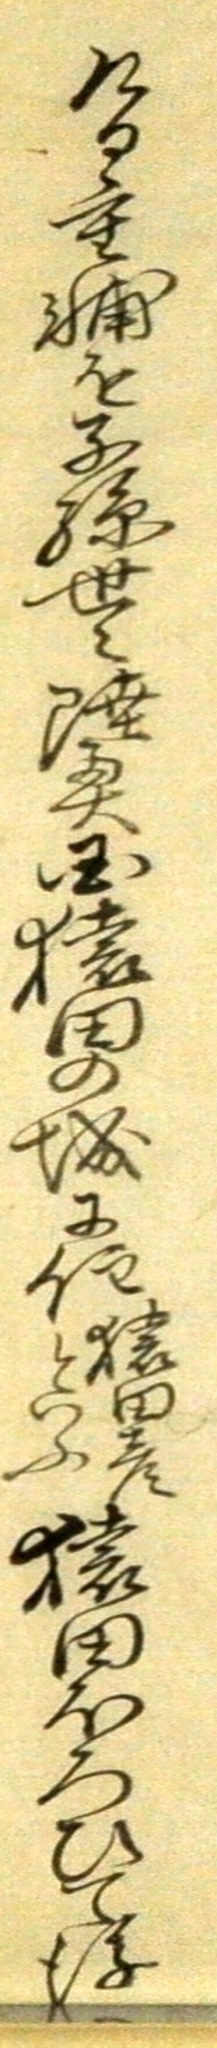ける重輔を子孫世々陸奥国猿田の城に住猿田彦といふ猿田ほろひて後
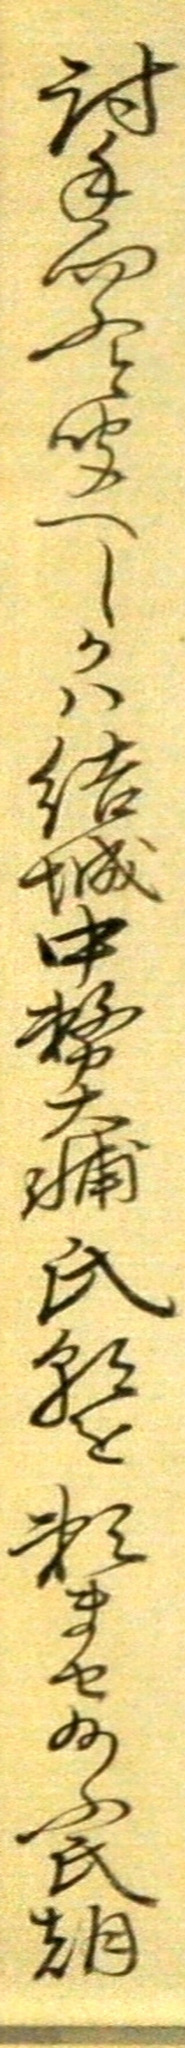討手向ふと聞へしかは結城中務大輔氏朝を頼ませ給ふ氏朝

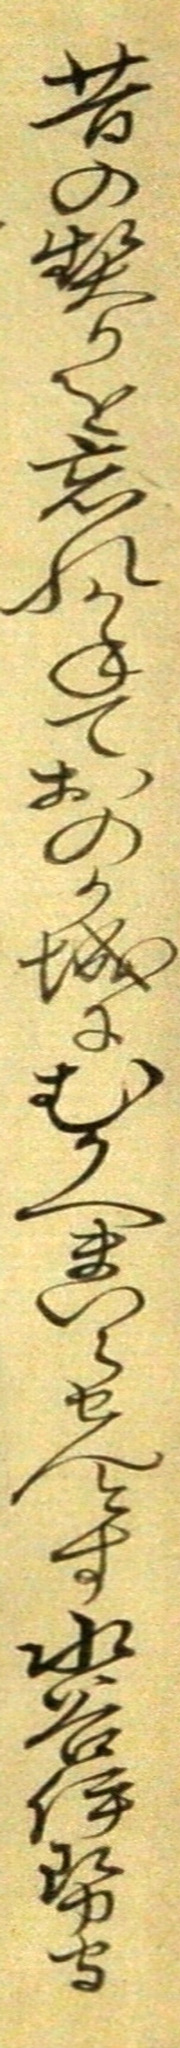昔の契を忘れかねておのか城にむかへまいらせんとす水谷伊勢守
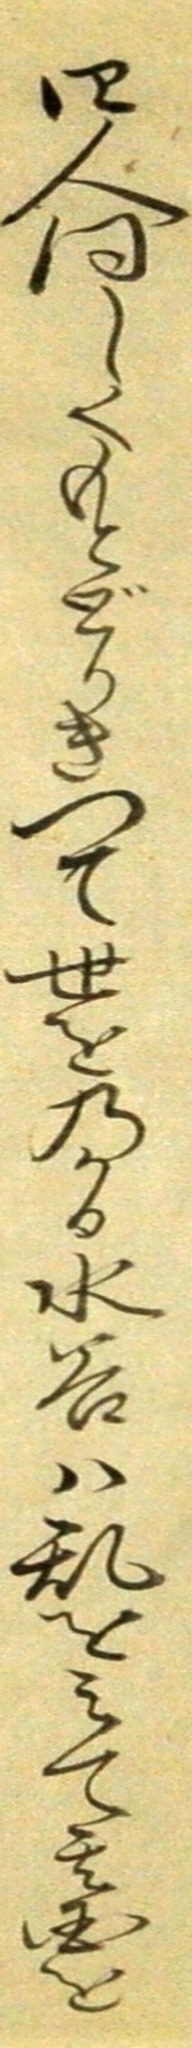四人同しくもとどりきつて世をのかる水谷は乱をみて其国を
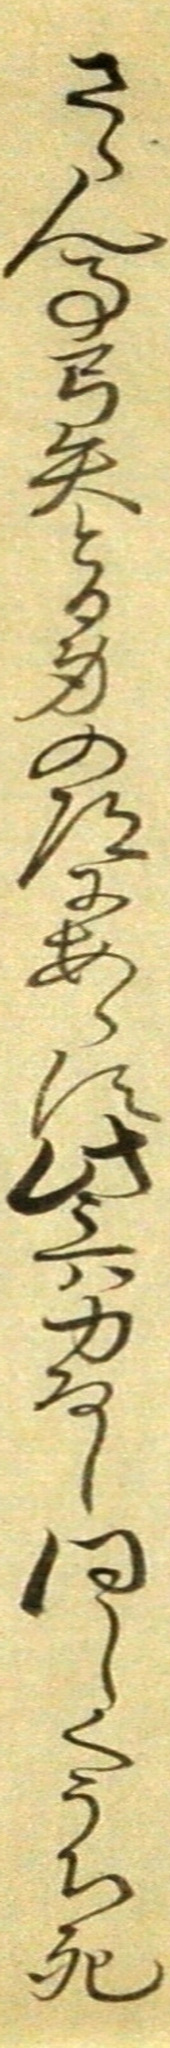さらん事弓矢とる身の道にあらす此上は力なし同しくうち死
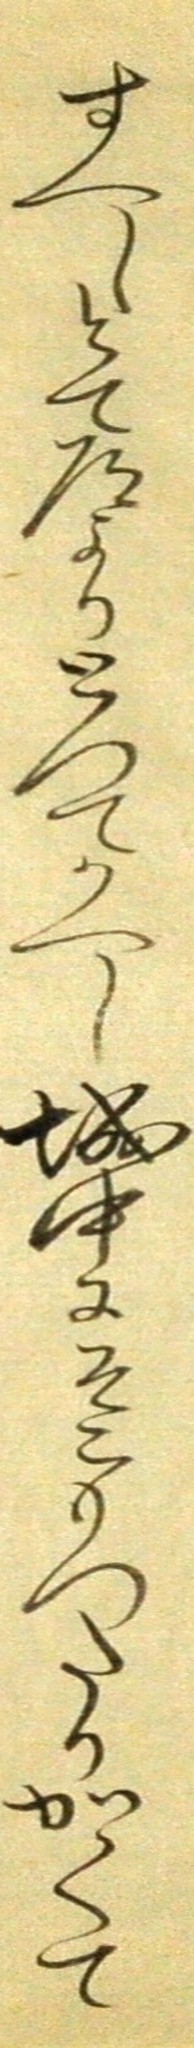すへしとて道よりとつてかへし城中にそこもつたりかくて
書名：藩翰譜（九・下）
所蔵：伊那市立高遠町図書館・合同会社AMANE
